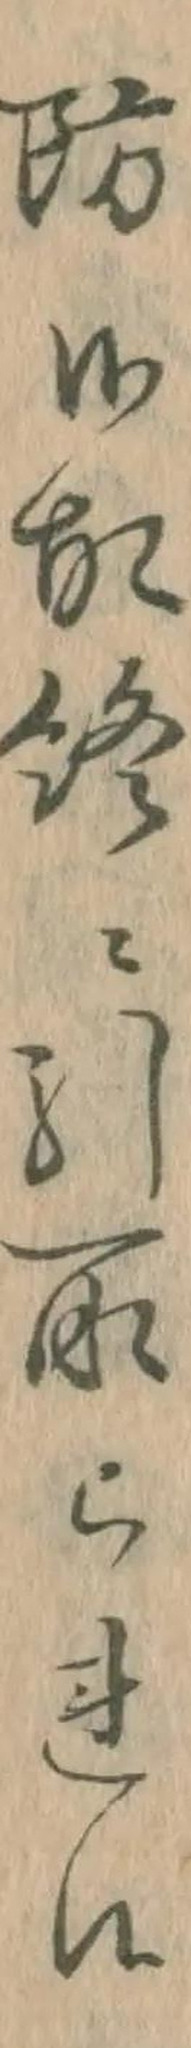防候故終に引取ら連候
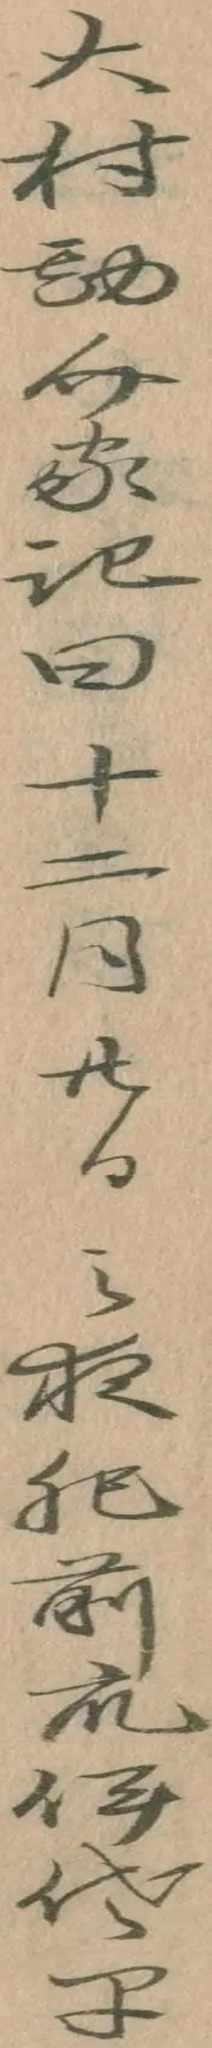大村勘介家記曰十二月廿日之夜肥前衆伊佐早
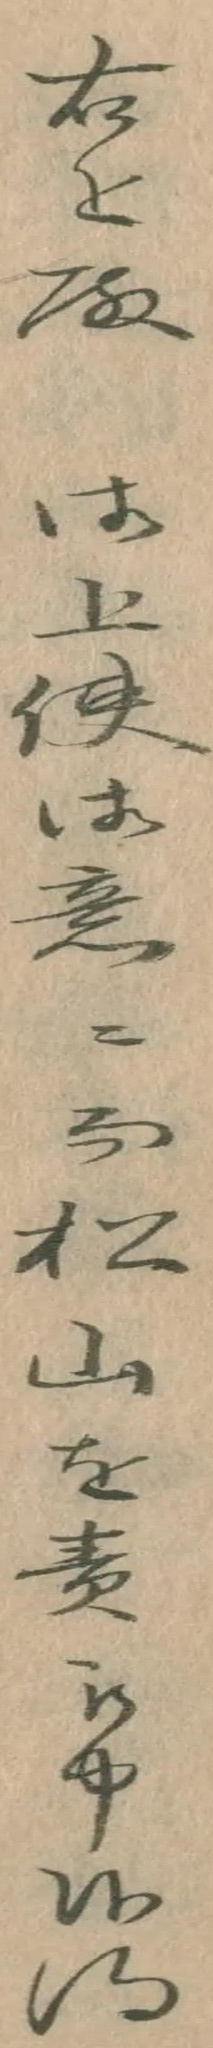右近殿御上使御意に而松山を責被申候得
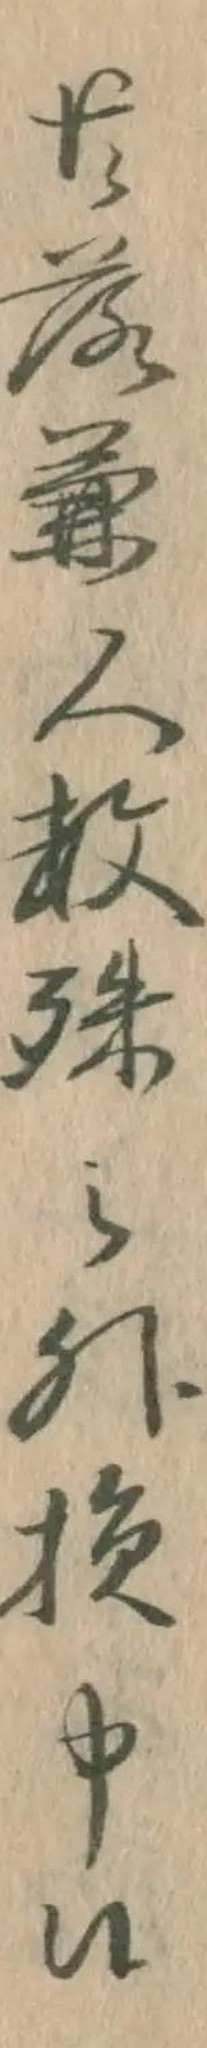共落兼人数殊之外損申候
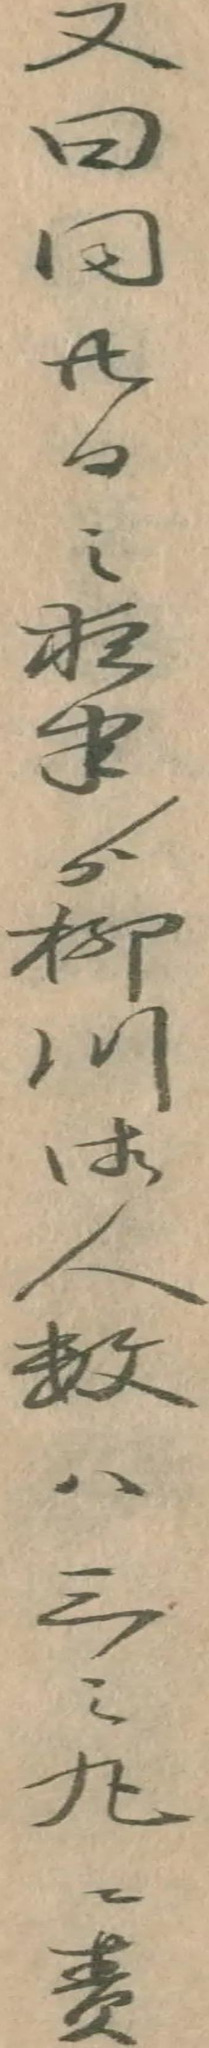又曰同廿日之夜半ゟ柳川御人数は三之丸に責
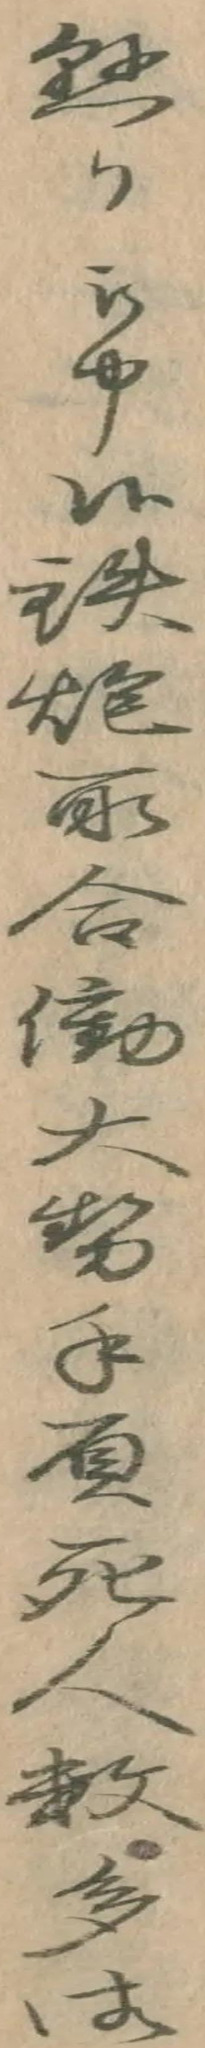懸り被申候鉄炮取合働大勢手負死人数多御

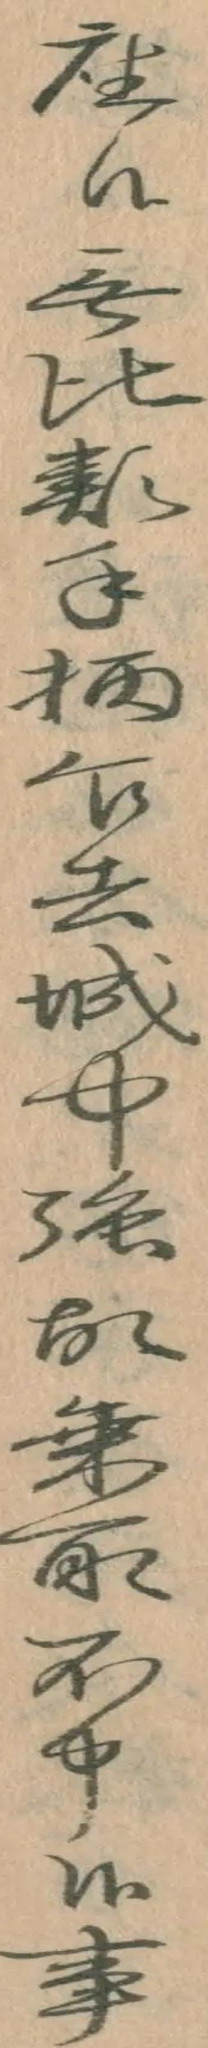座候無比類手柄乍去城中強故乗取不申候事
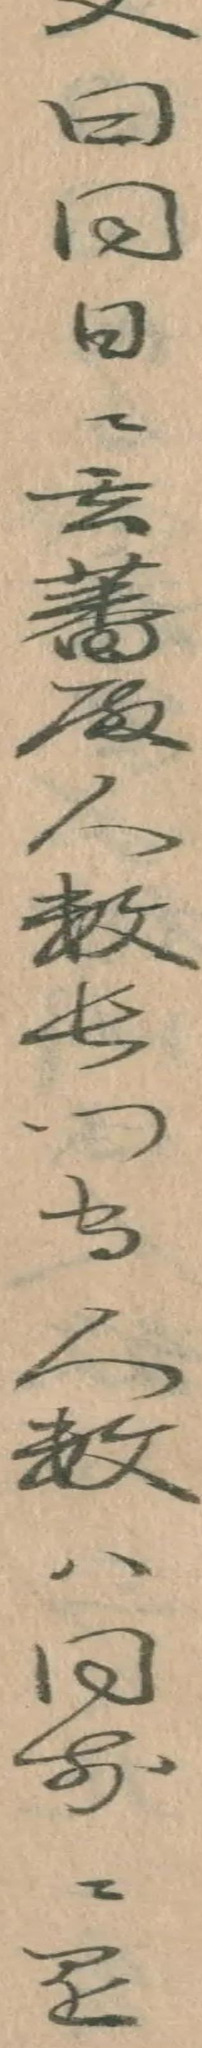又曰同日に玄蕃殿人数長門守人数は同前に懸
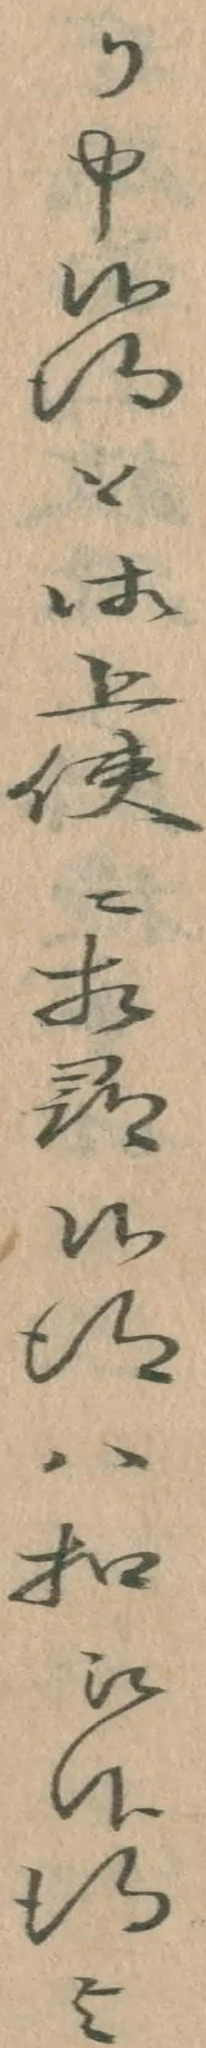り申候得と御上使に相尋候得は扣江候得与
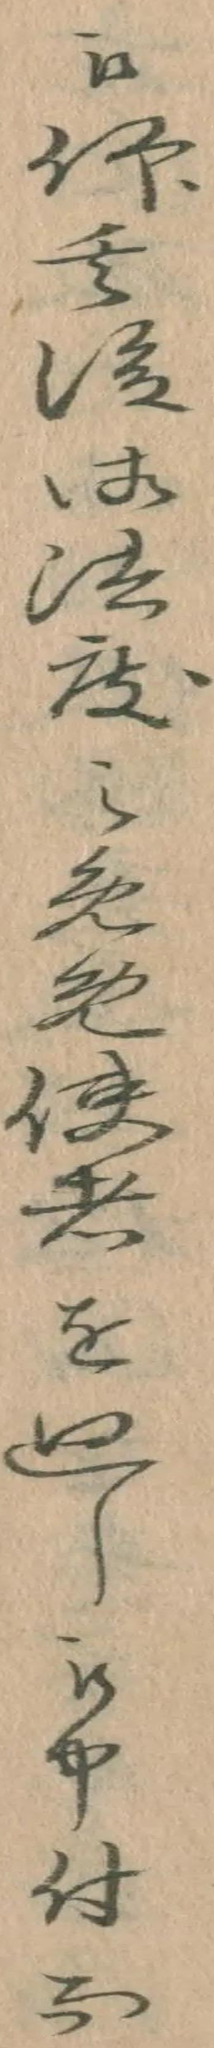被仰其後御法度之免免使者を廻し被申付而
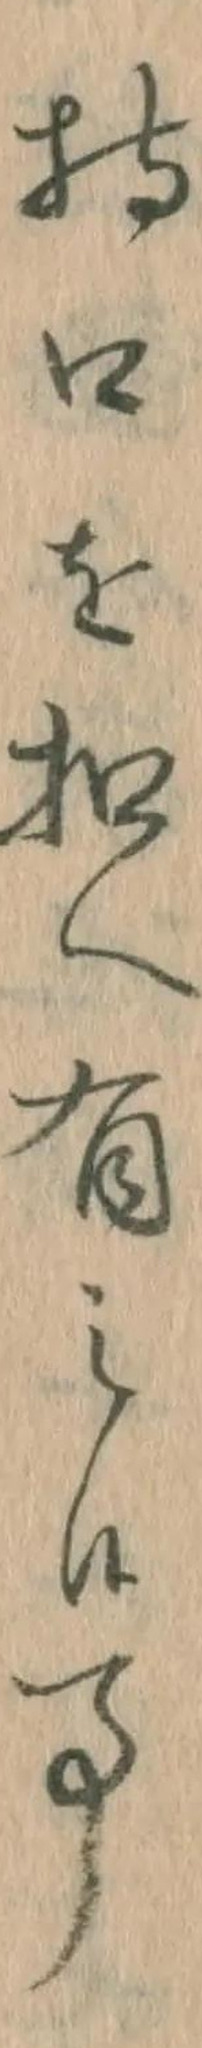持口を扣へ有之候事
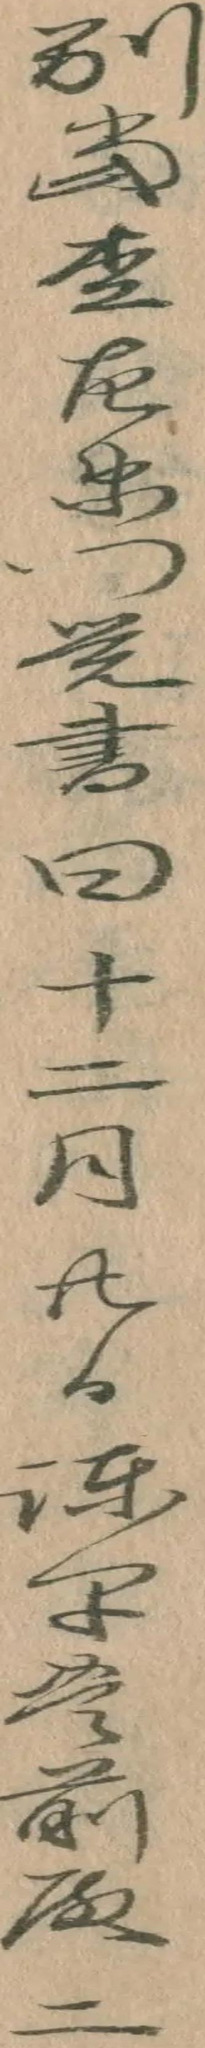別当杢左衛門覚書曰十二月廿日諌早豊前殿二
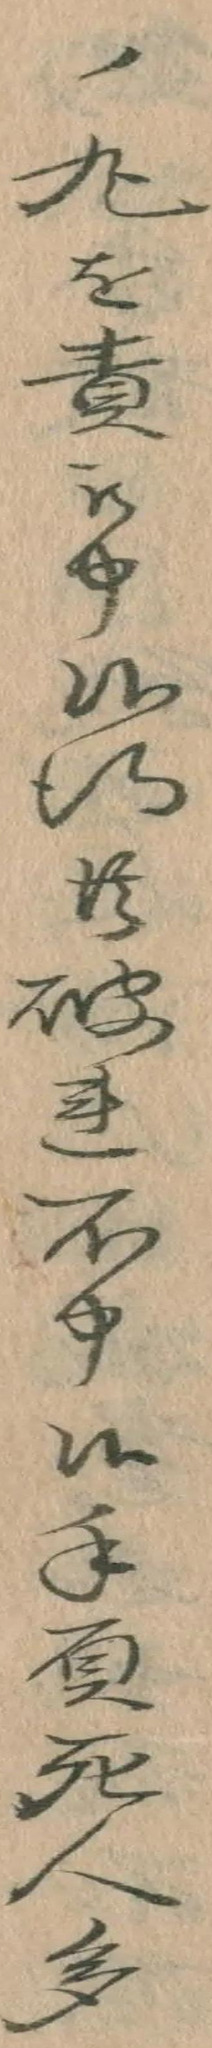之丸を責被申候得共破連不申候手負死人多
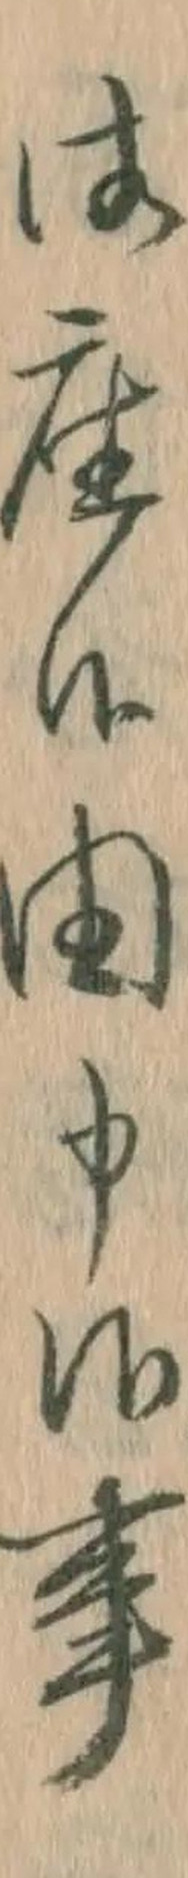御座候由申候事
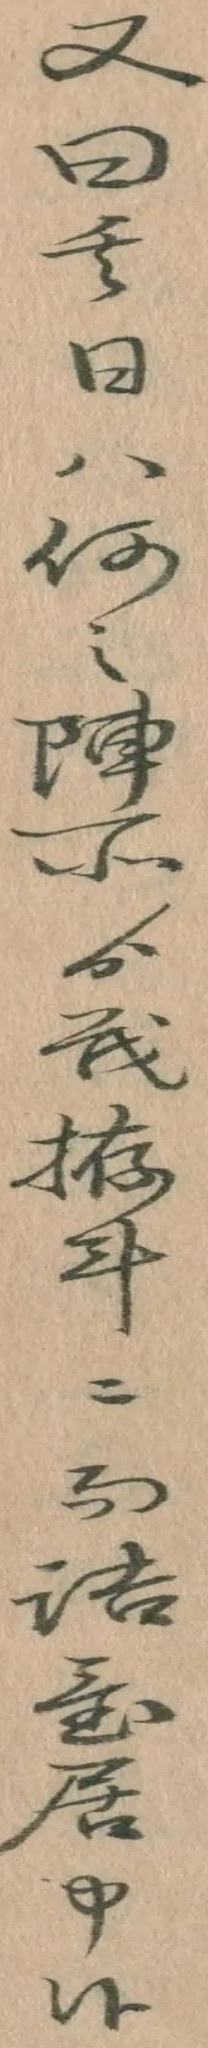又曰其日は何之陣所ゟ茂拵斗に而詰置居申候
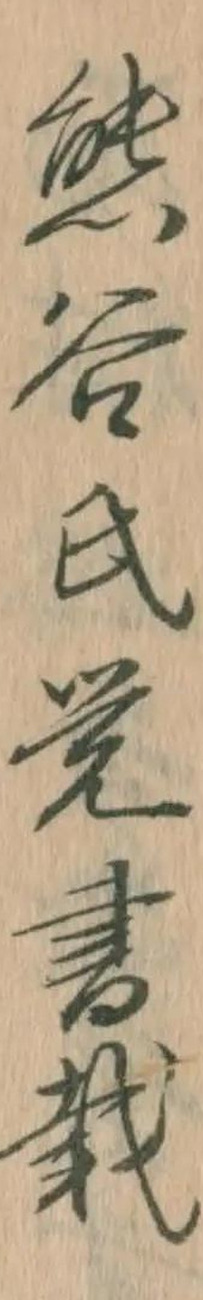熊谷氏覚書載
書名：切支丹御退治記 49巻. [4]
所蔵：国立国会図書館 National Diet Library, JAPAN
